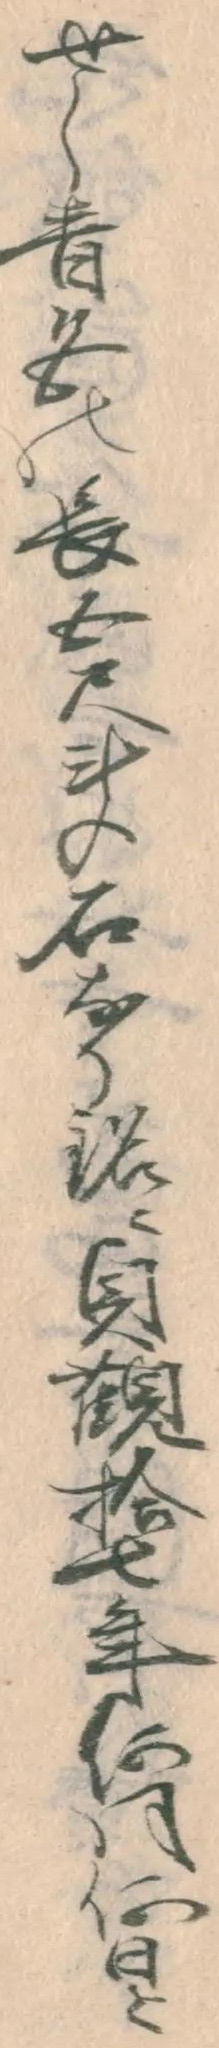せし青色の長五尺斗の石なり銘に貞観拾七年何月何日と
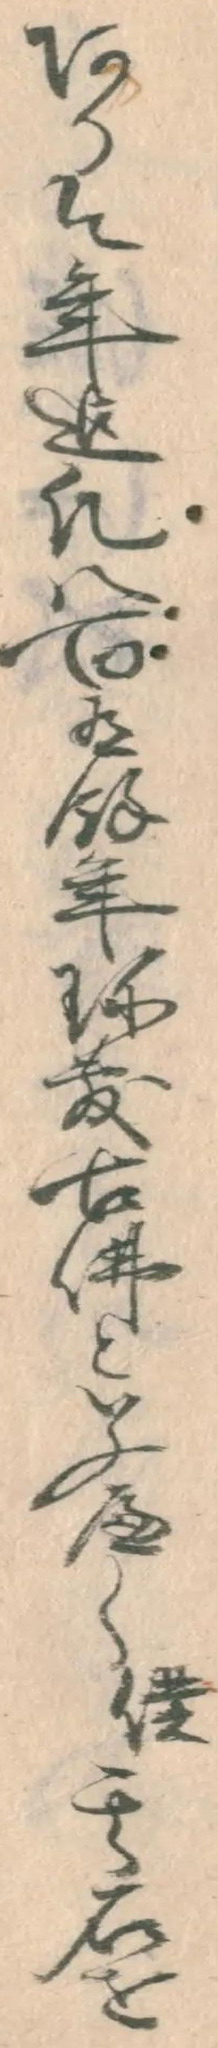ありて今年迄凡八百有余年珍敷古仏といふへし僕其石を
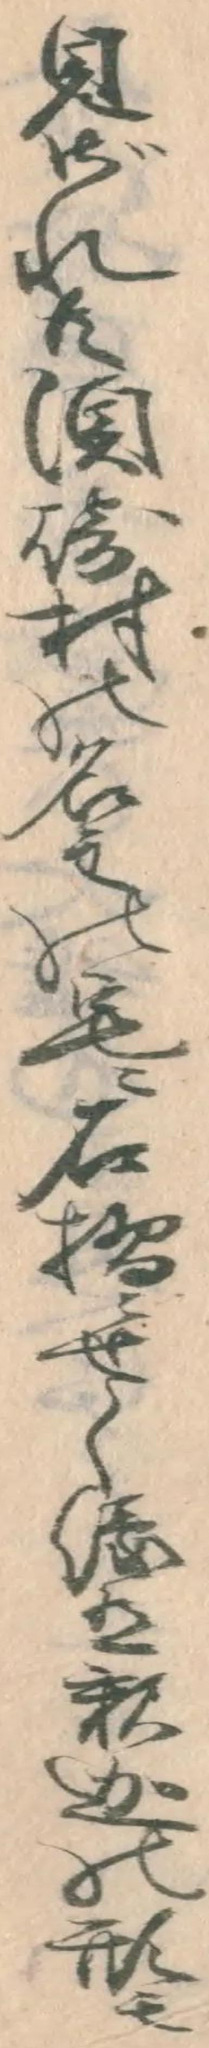見ざれ共須崎村の名主の宅に石摺にせし像有釈迦の形も

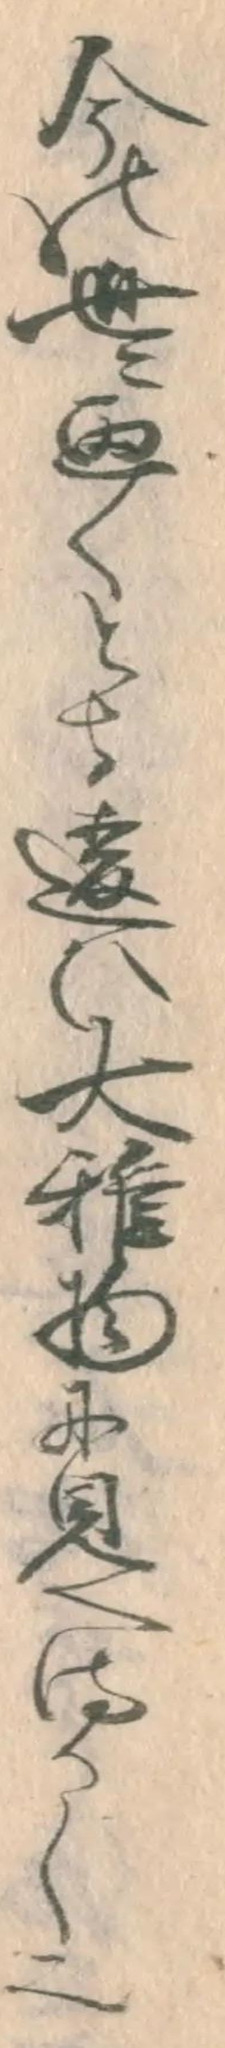今の世に画くとは違ひ大雅？物に見へ侍りし也
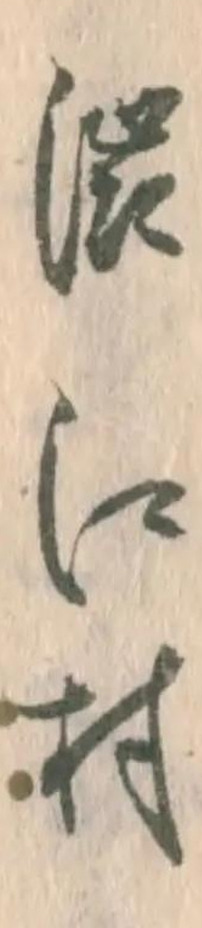渋江村
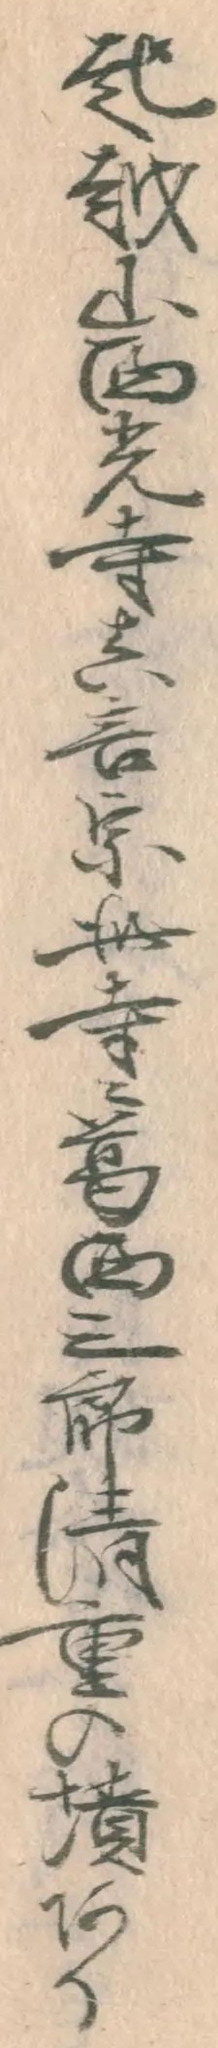超越山西光寺真言宗此寺に葛西三郎清重の墳あり
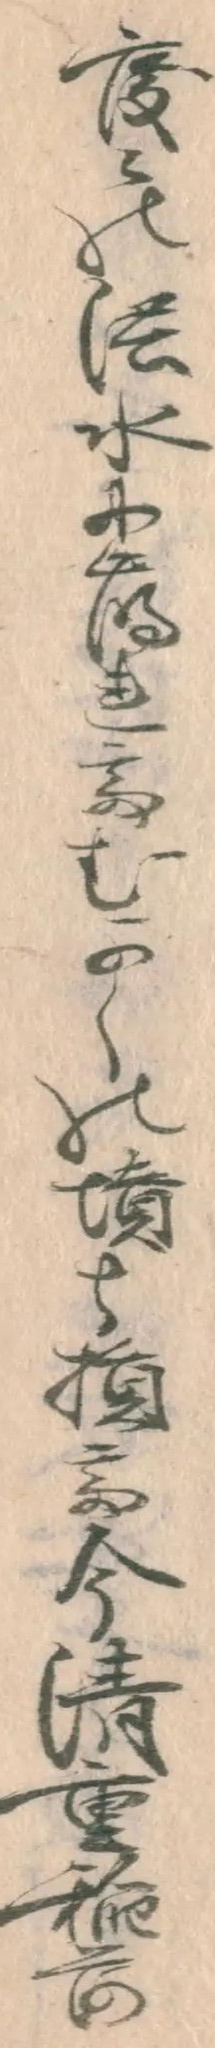度々の洪水に崩れてむかしの墳は損て今清重稲荷
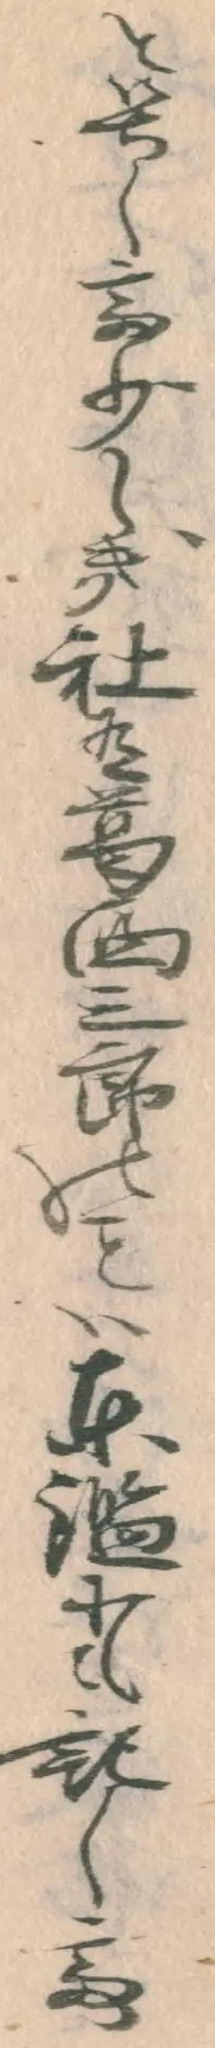と号して少しき社有葛西三郎のことは東鑑にも記して
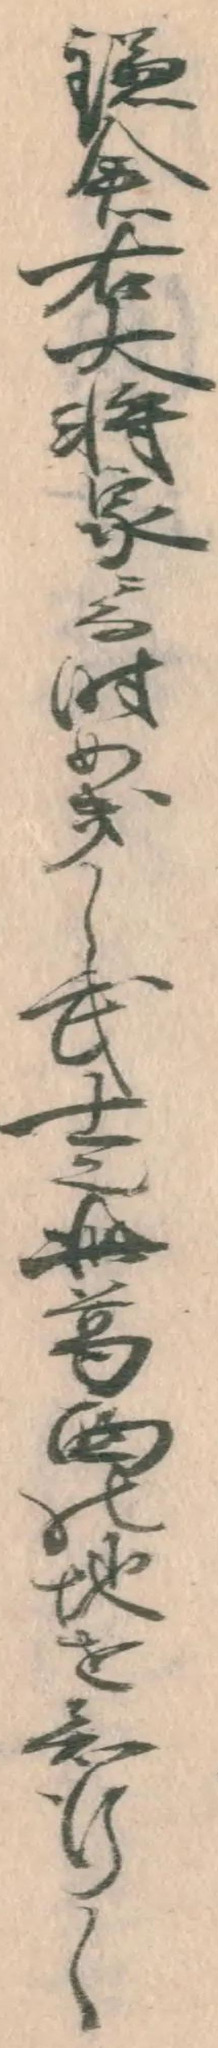鎌倉右大将家にて時めきし武士也此葛西の地を知行し
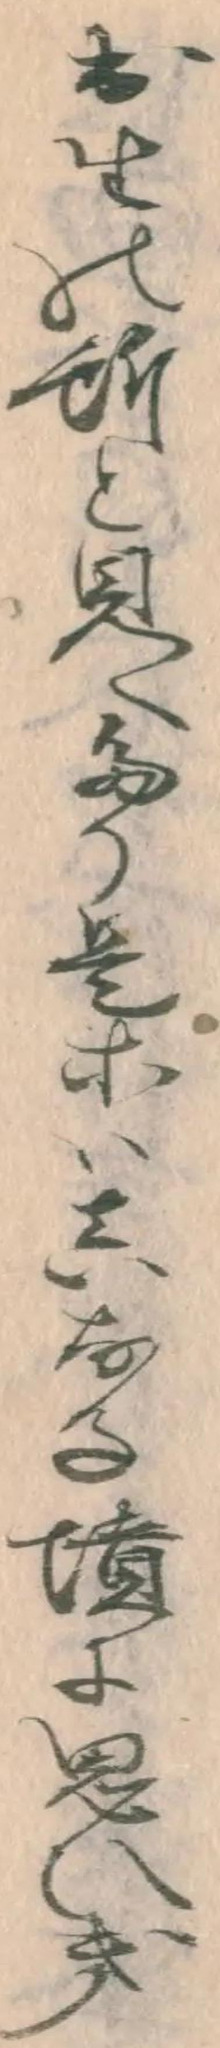出生の所と見へたり是等は真なる墳に思ひき
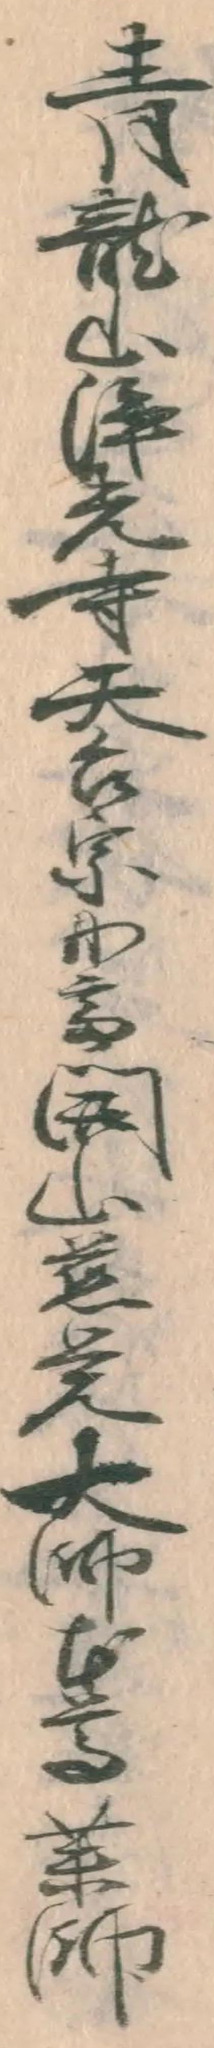青竜山浄光寺天台宗にて開山慈覚大師本尊薬師
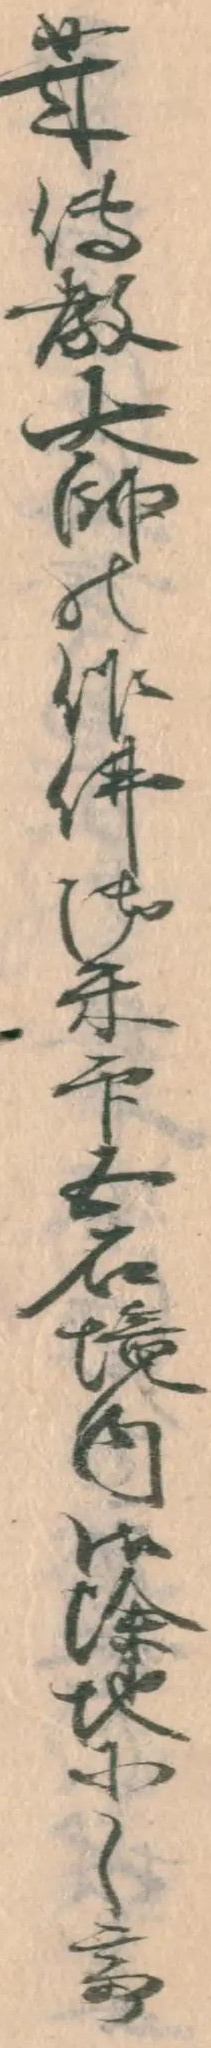如来伝教大師の作仏御朱印五石境内御除地にして
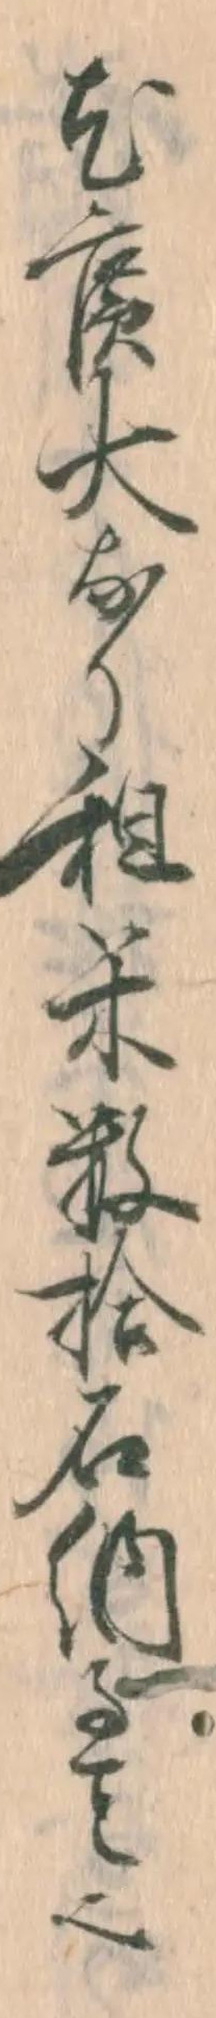尤広大なり租米数拾石納る事也
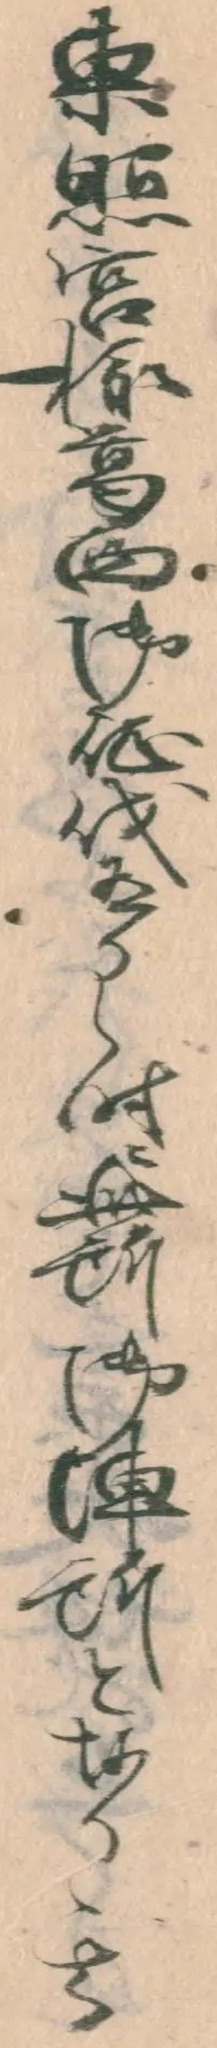東照宮様葛西御征伐有りし時に此所御陣所となり其
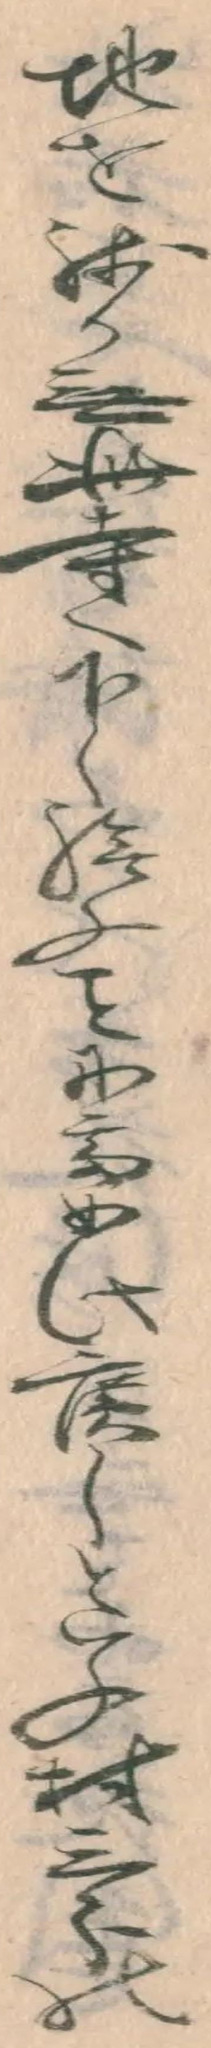地を残り無此寺へ下し給ふことにて如此広しといふ村三分の
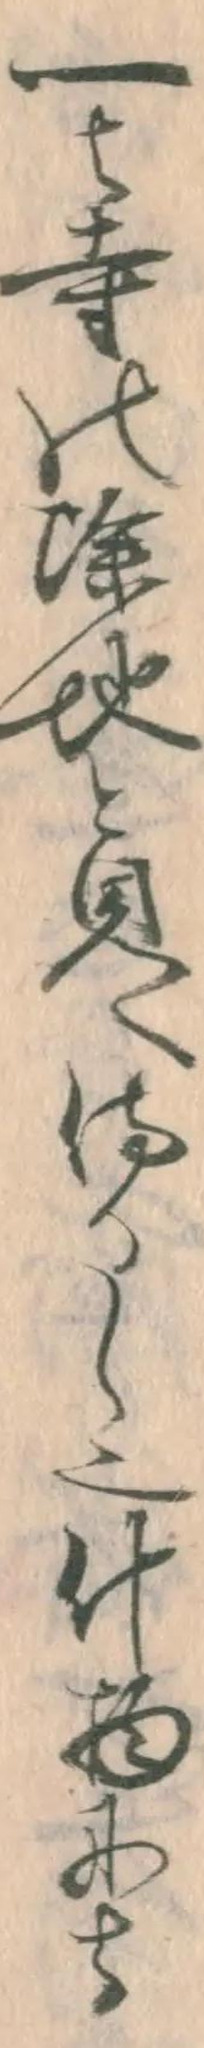一は寺の除地と見へ侍りし也什物にて
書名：四神地名録 6巻. [4]葛飾郡
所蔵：国立国会図書館 National Diet Library, JAPAN
